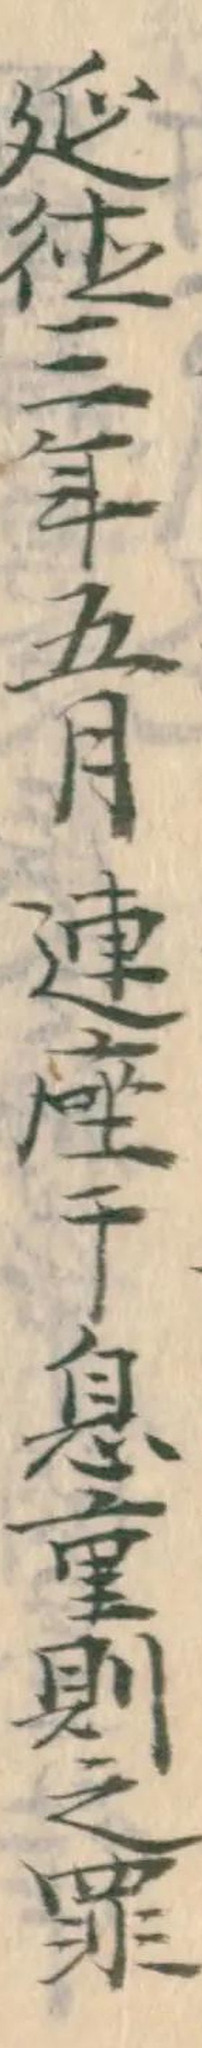延徳三年五月連座于息重則之罪
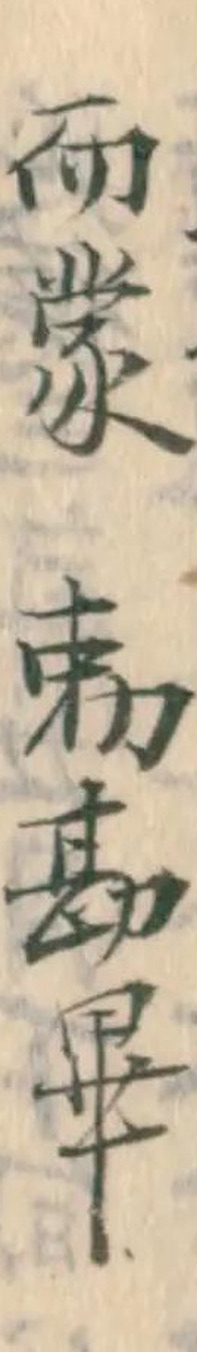而蒙勅勘畢
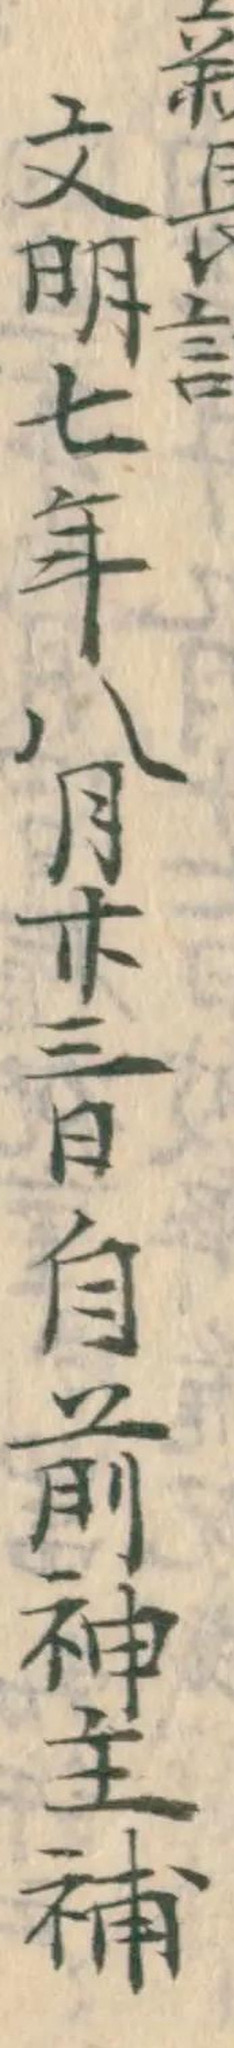延久文明七年八月廿三日自前神主補
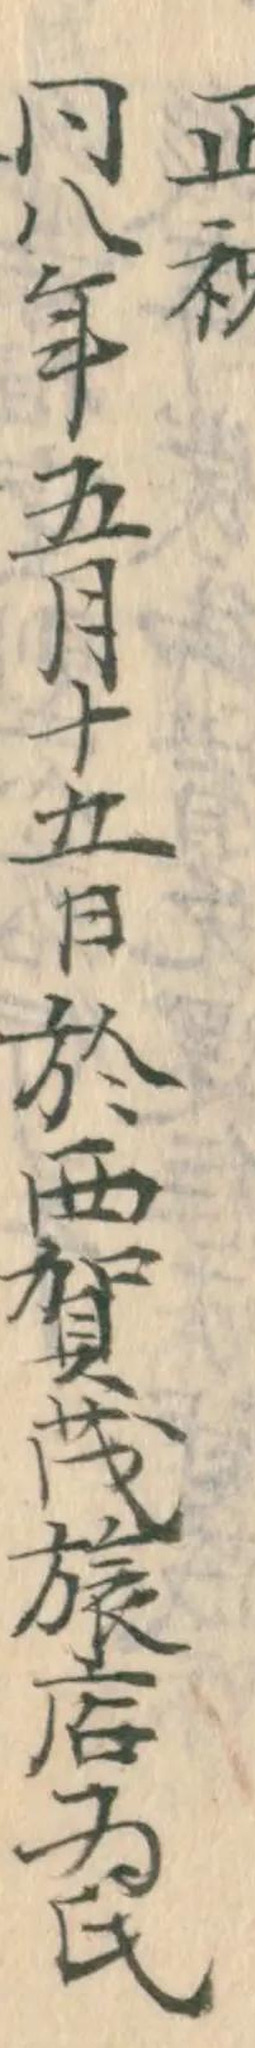同八年五月十五日於西賀茂旅店為氏
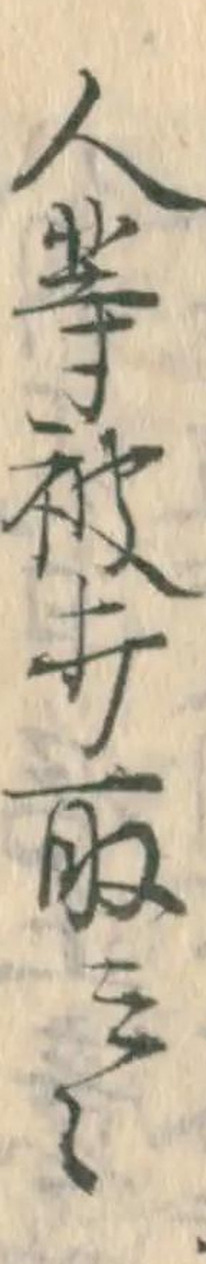人等被打取云々
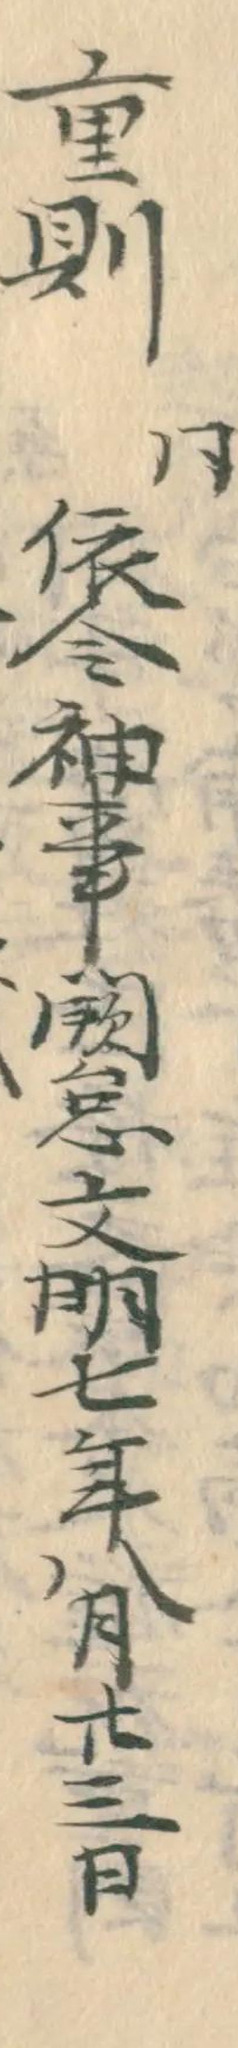重則依令神事闕怠文明七年八月廿三日
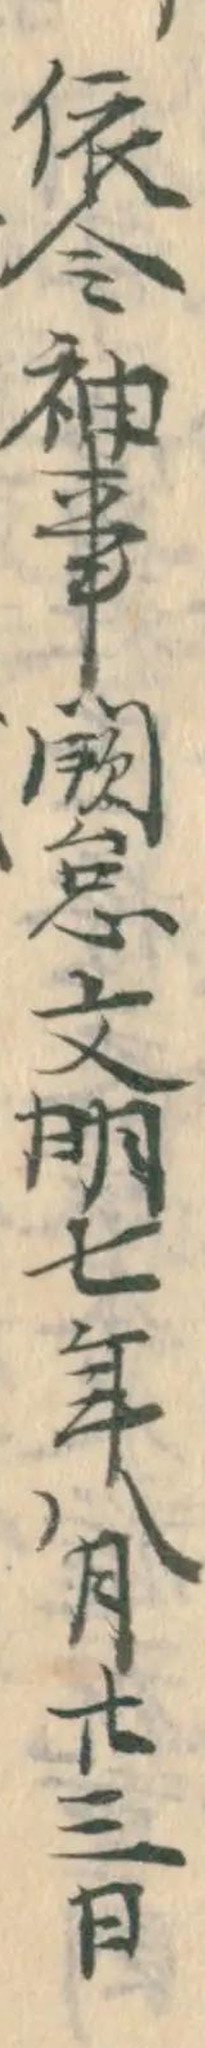依令神事闕怠文明七年八月廿三日
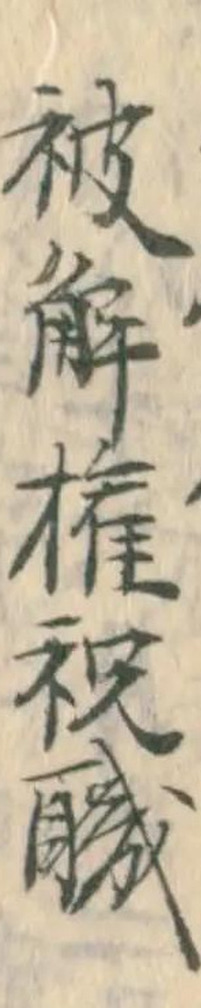被解権祝職

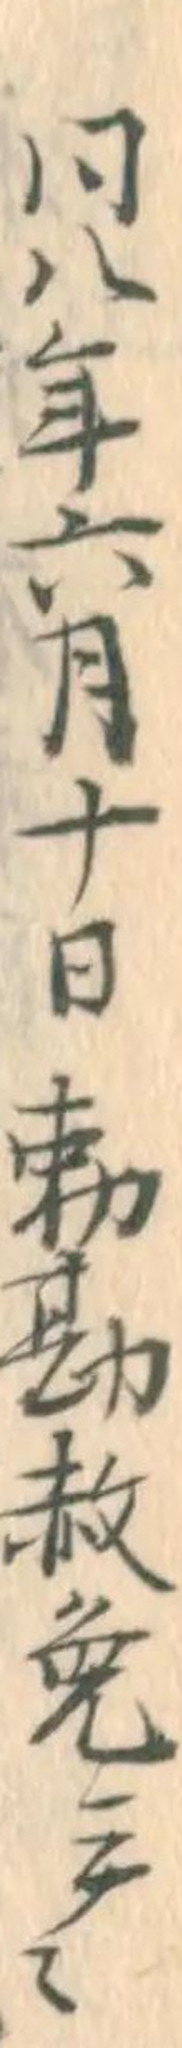同八年六月十日勅勘赦免云々
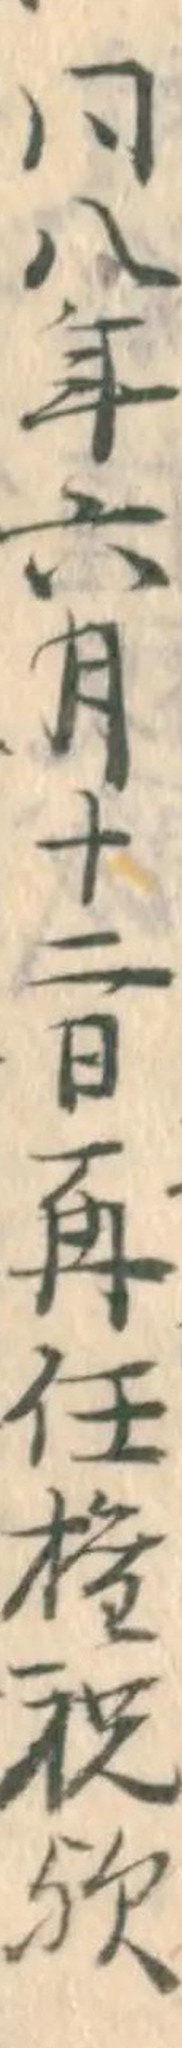同八年六月十二日再任権祝歟
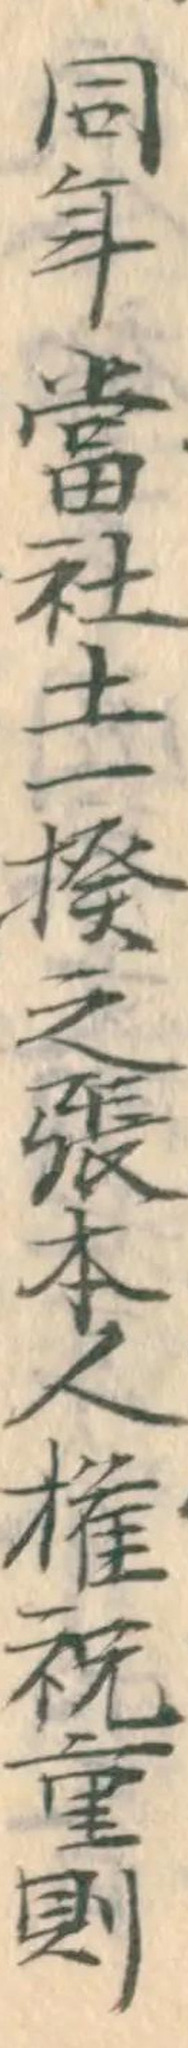同年当社土一揆之張本人権祝重則
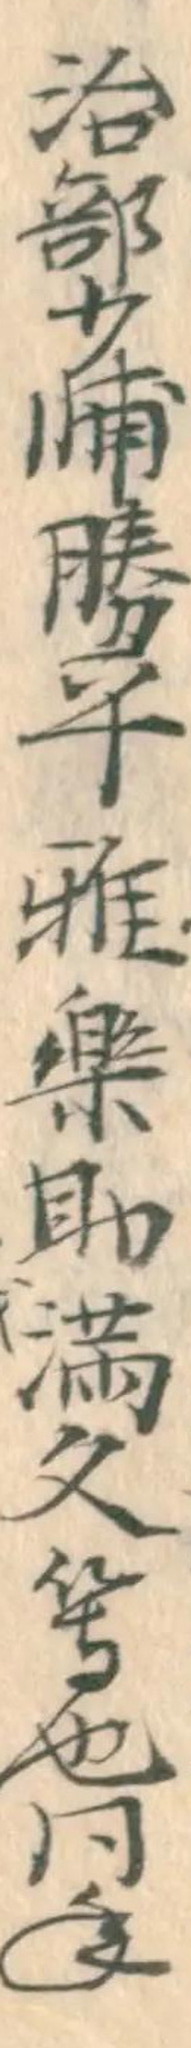治部少輔勝平雅楽助満久等也同年
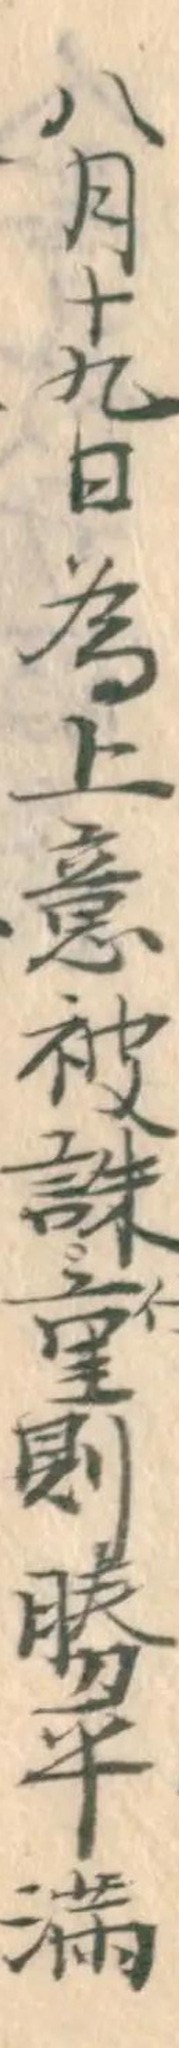八月十九日為上意被誅◦重則勝平満
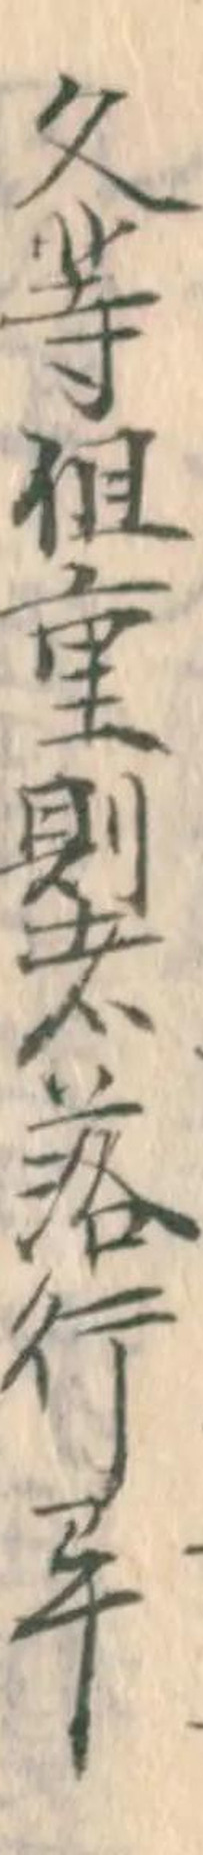久等但重則者落行畢
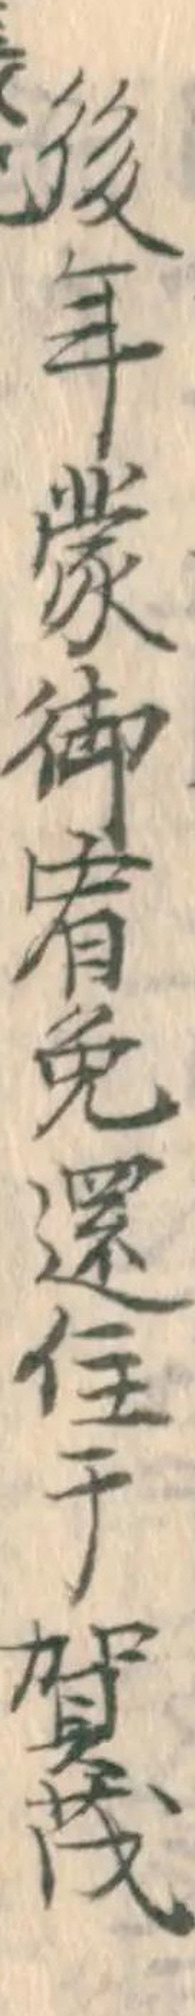後年蒙御宥免還住于賀茂
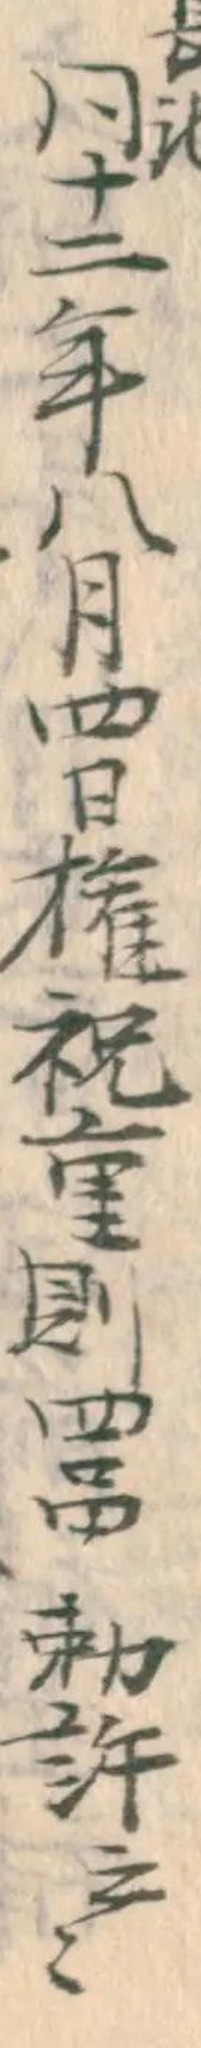同十二年八月四日権祝重則四品勅許云々
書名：賀茂社記録. 第23冊
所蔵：国立国会図書館 National Diet Library, JAPAN
